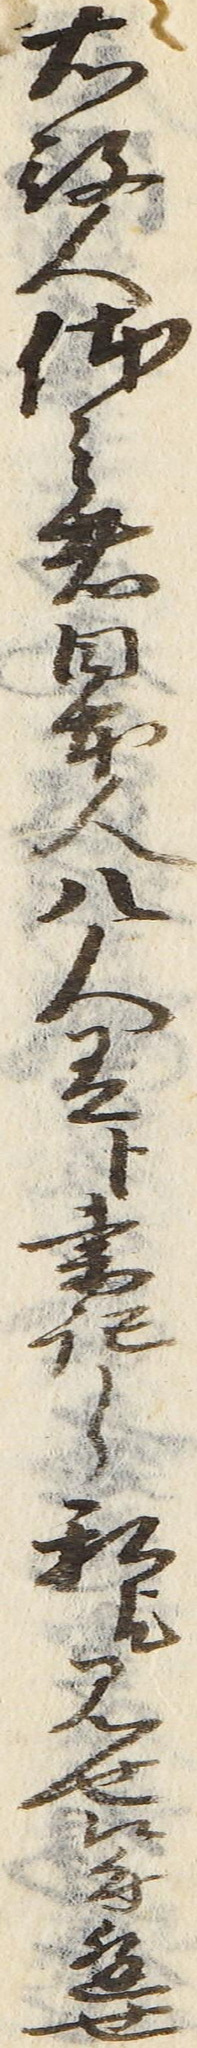右役人体之者日本人八人有ト書記し私江見せ候付逢せ
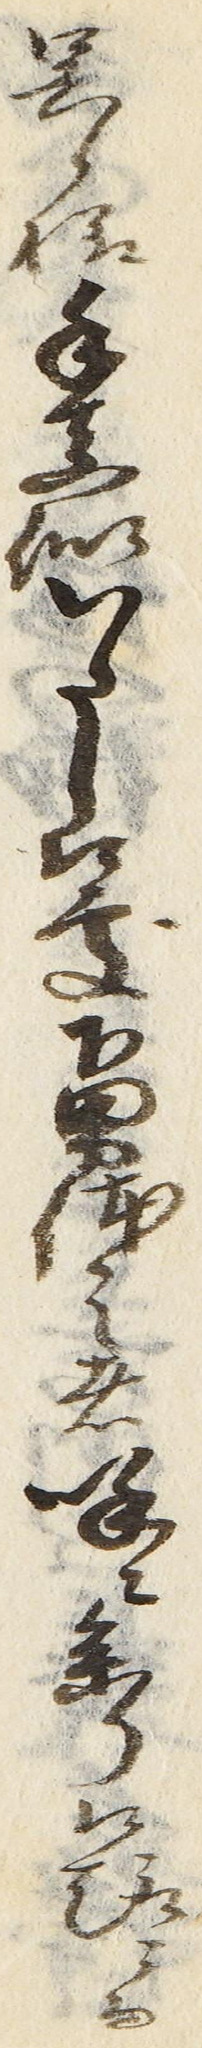呉候様手真似いたし候處下男体之者呼ニ参り候趣ニ而
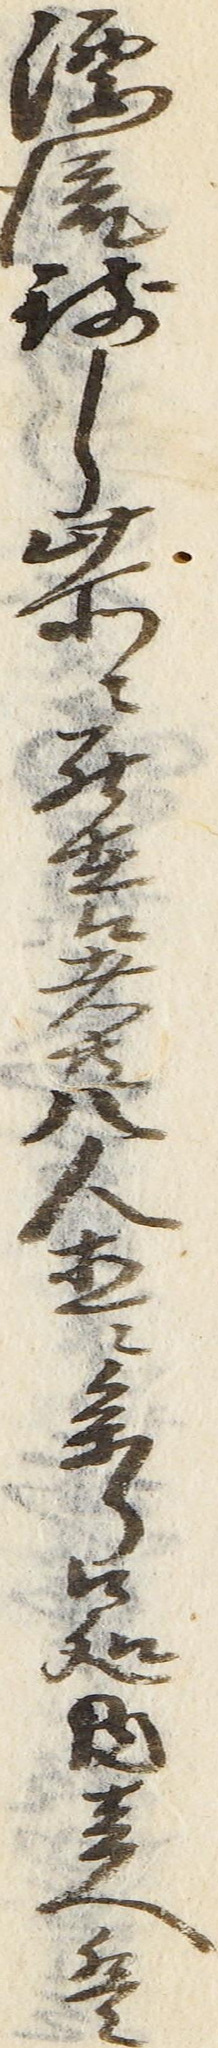漂流致し此所ニ罷在候者共八人直ニ参り候処内壱人は
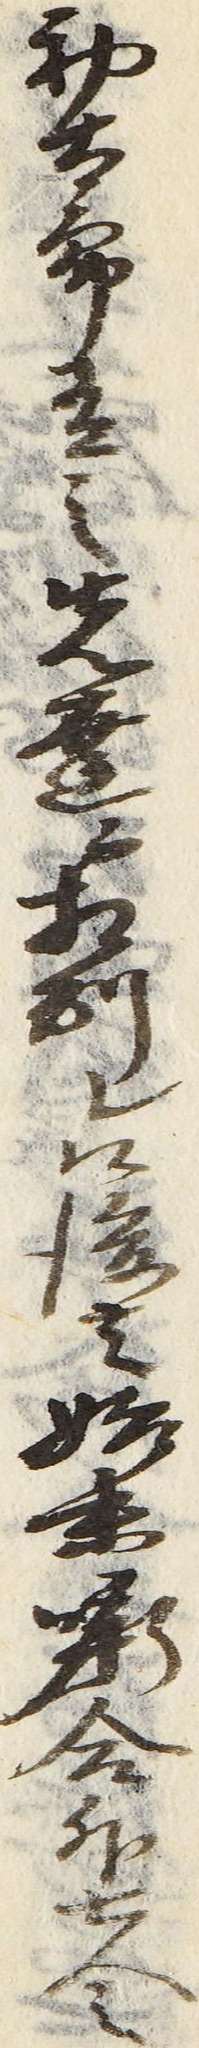初太郎有之先達而相別レ候後者始末噺合外七人之
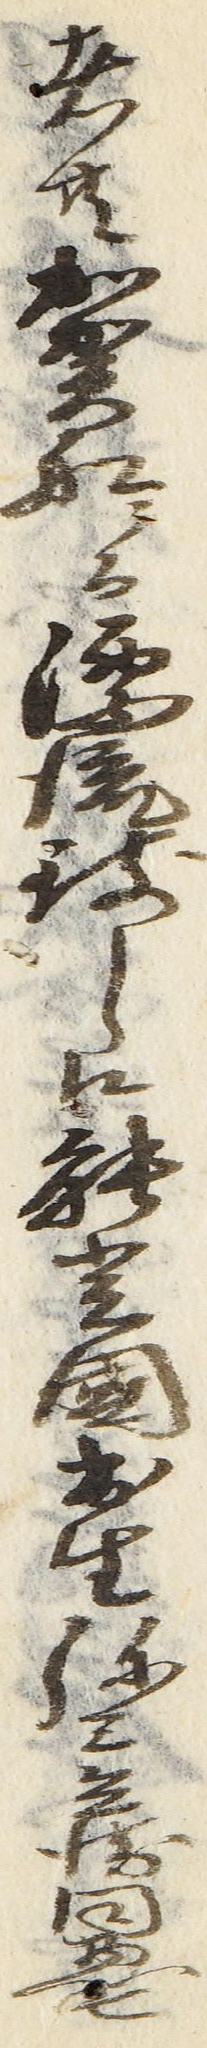者共加賀舩ニ而漂流致し候能登國出生弥三兵衛同惣七
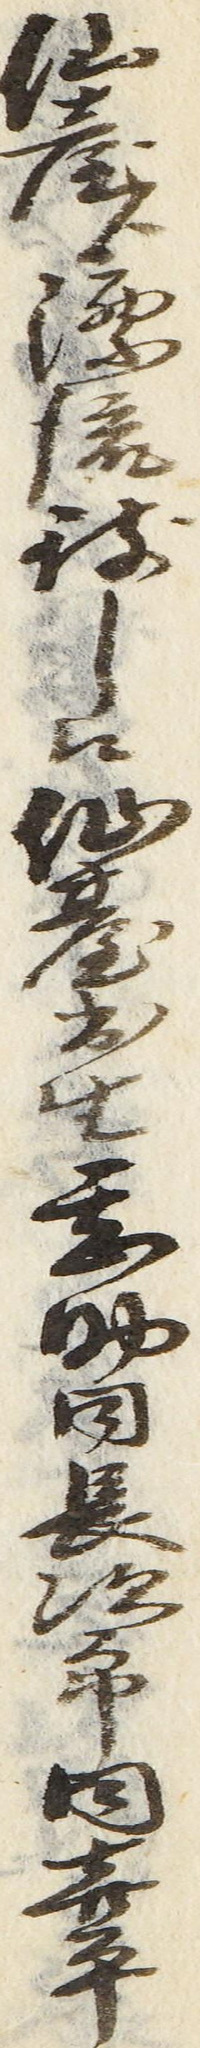仙臺ゟ漂流致し候仙臺出生甚助同長次郎同喜平
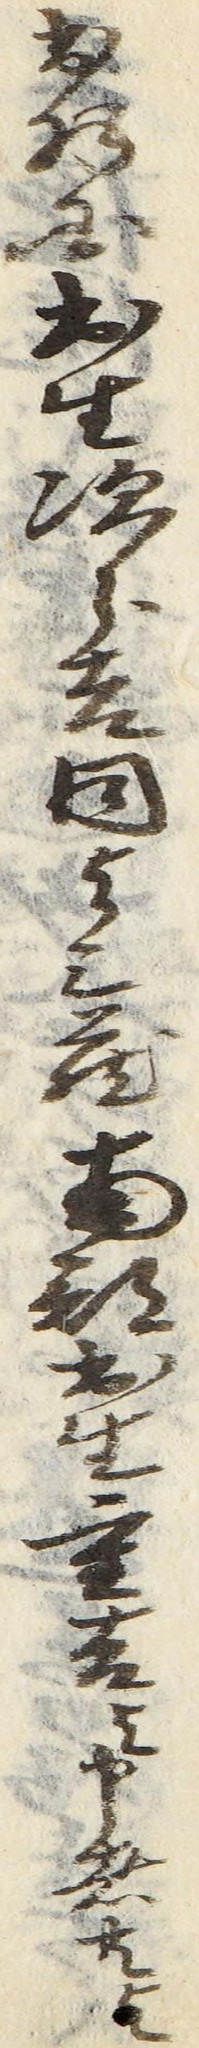出羽国出生次郎吉同与三蔵南部出生重吉と申者共と

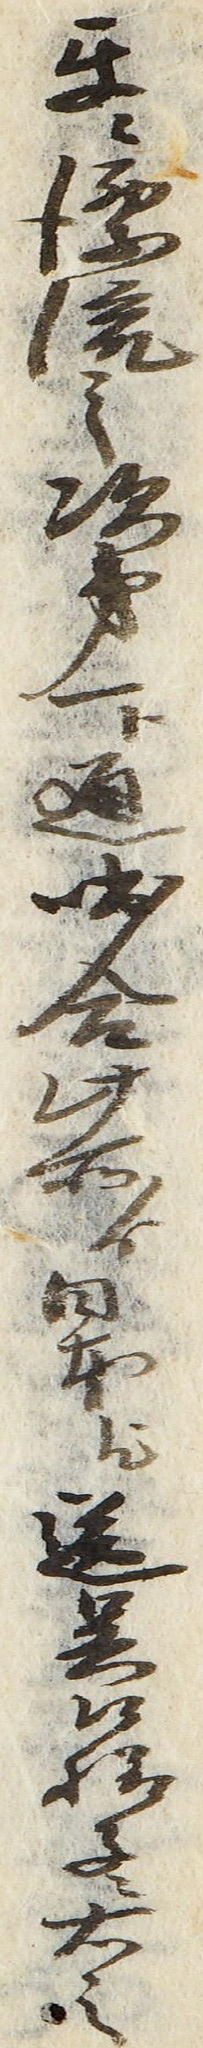互ニ漂流之次第一ト通咄合此所ゟ日本江送呉候様子ニ右之
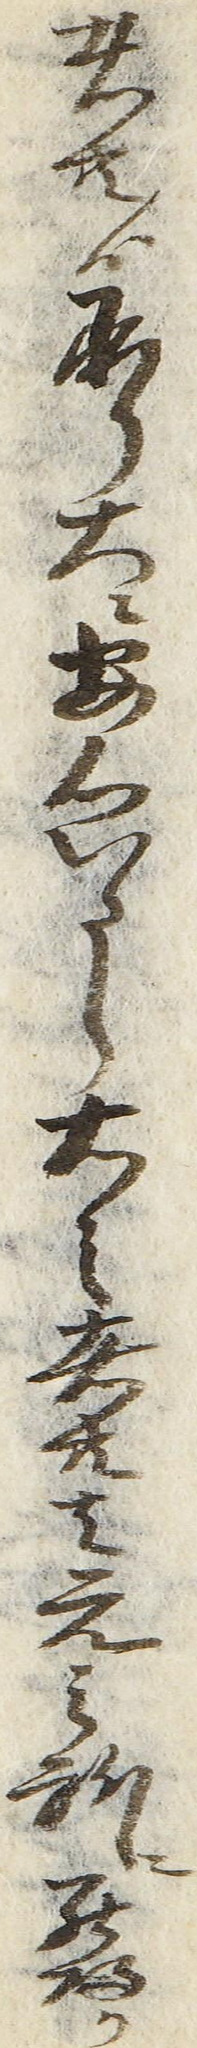者共ゟ承り大ニ安心いたし右之者共者元之所ニ罷帰り
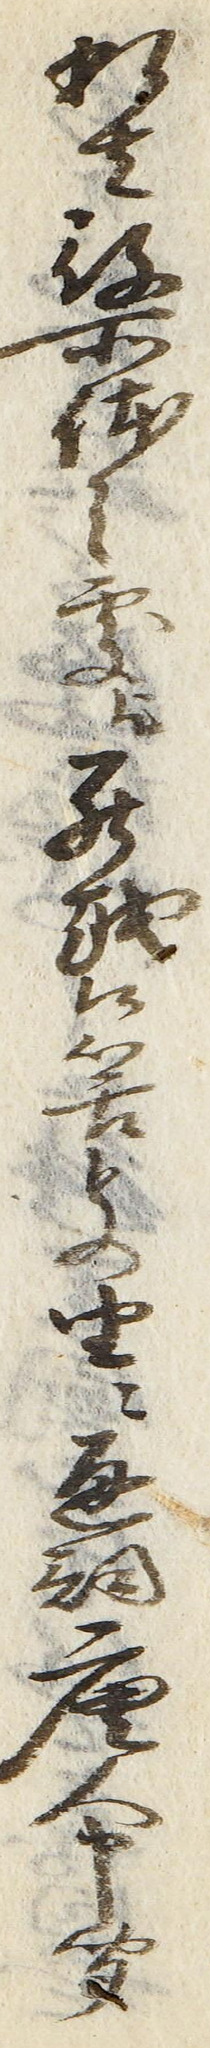私者役所体之處江罷越候筈との由ニ通詞唐人申聞
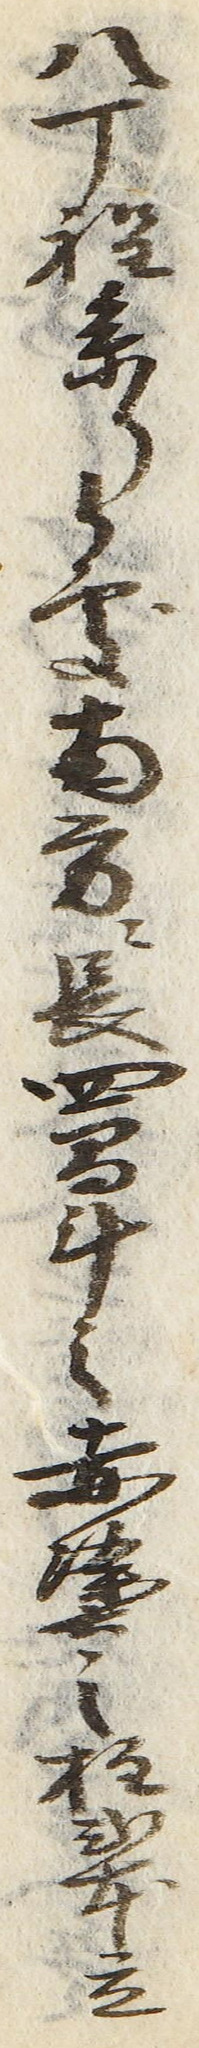八丁程参り候處南方ニ長四間斗之赤塗之柱弐本立
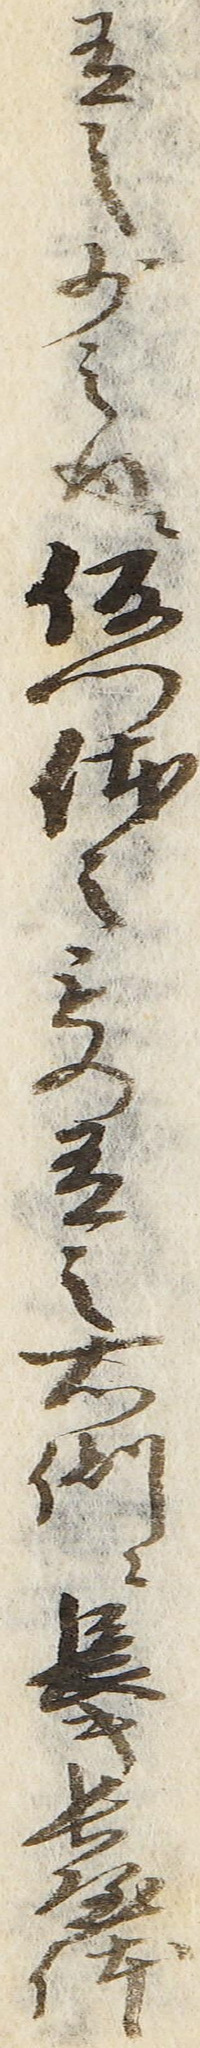有之少之内ニ仮門体之もの有之右側ニ長キ長屋体
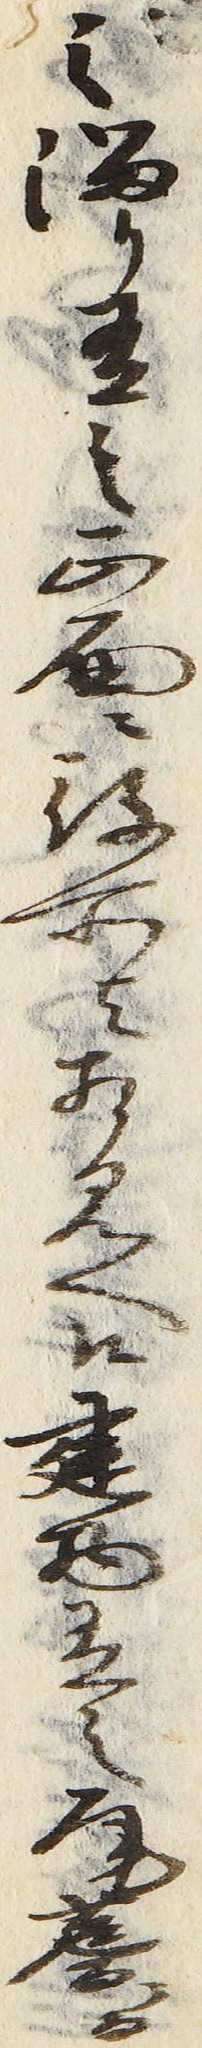之溜り有之正面ニ役所と相見へ候建物有之瓦葺ニ而
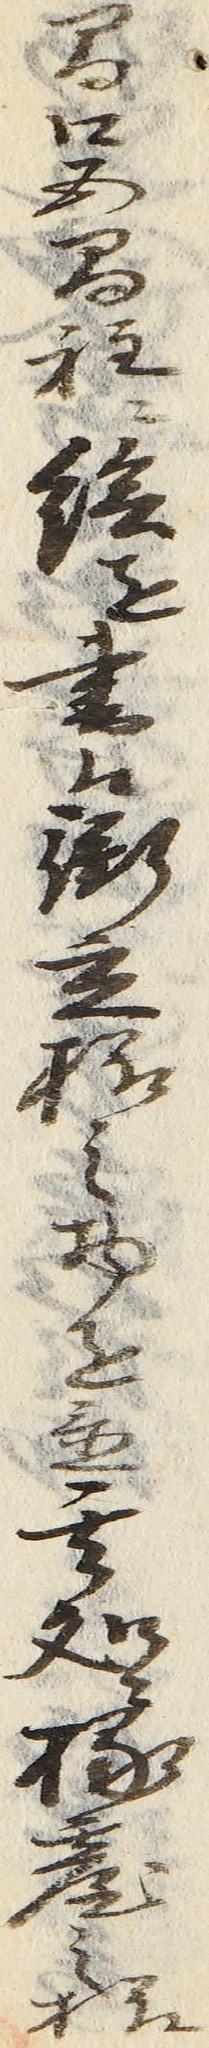間口五間程ニ絵を書候衝立様之物を置其処ニ椽臺之様
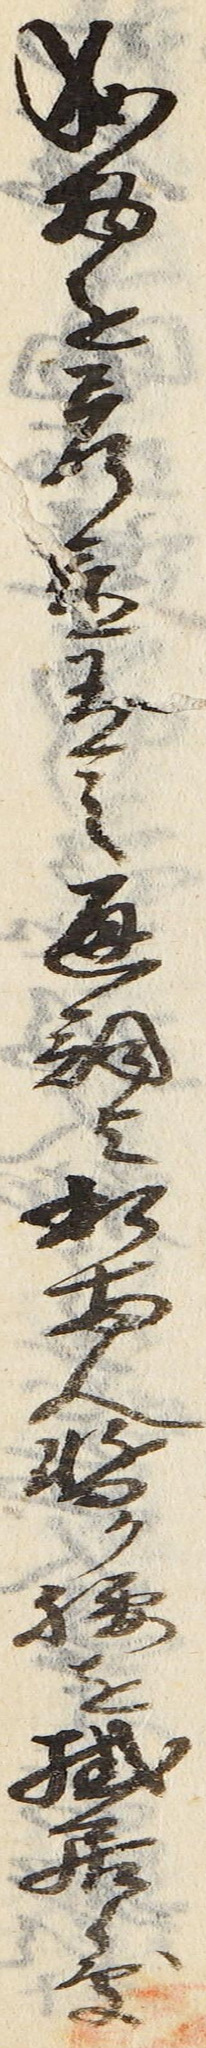成物を差置有之通詞と私両人暫ク腰を掛居候處
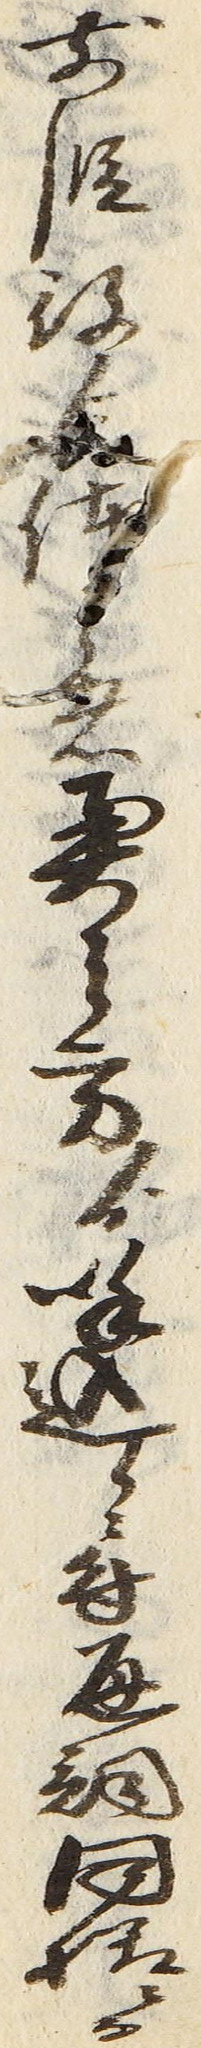前段役人体之者奥之方ゟ呼込候ニ付通詞同様ニ而
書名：漂流人善助聞書
